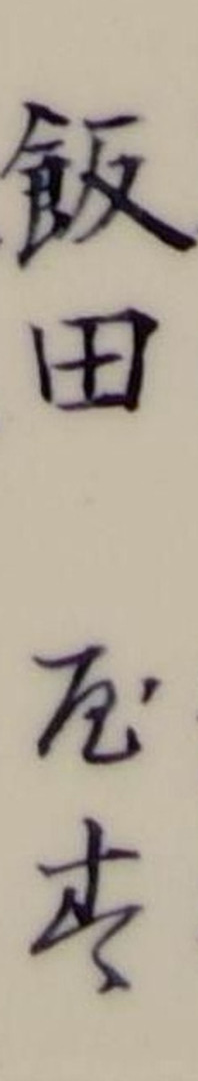飯田やす
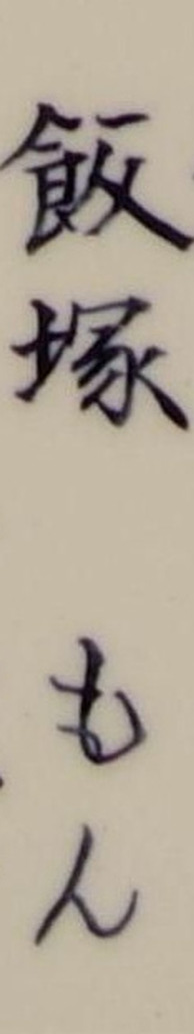飯塚もん
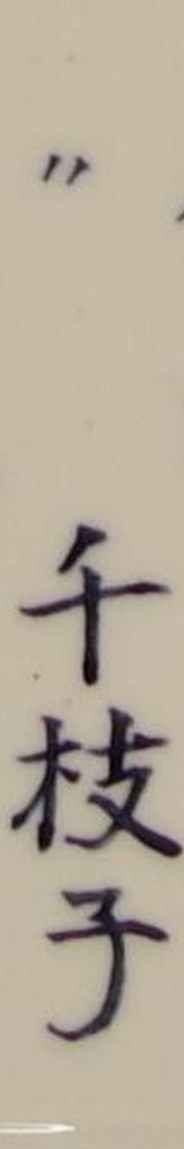千枝子
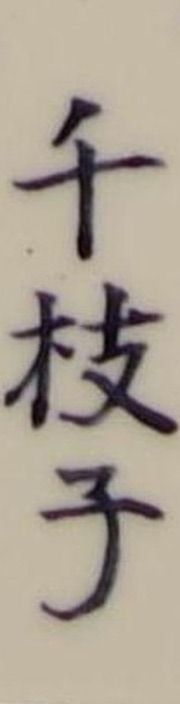千枝子
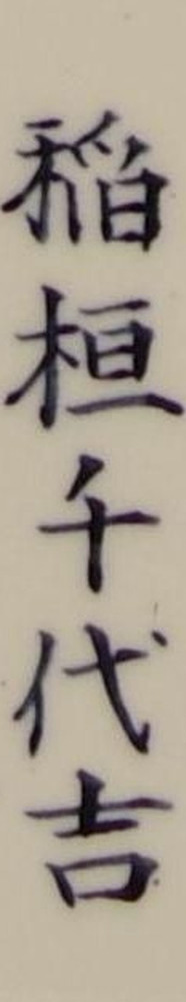稲桓千代吉
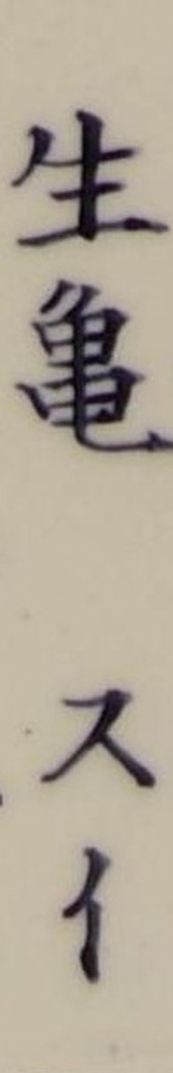生亀スイ
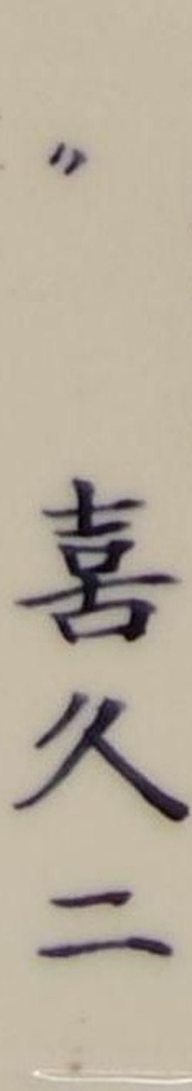喜久二
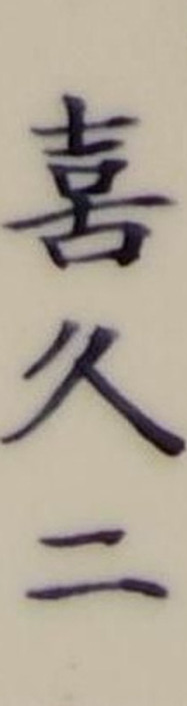喜久二
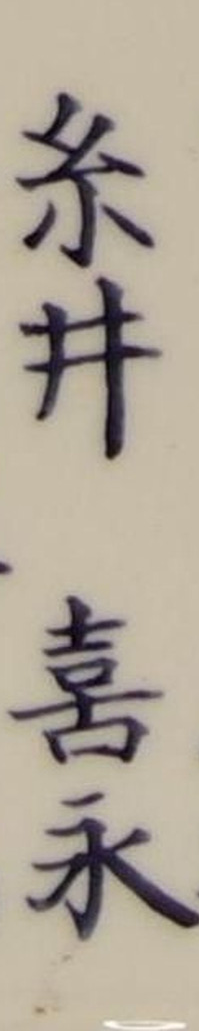糸井喜永
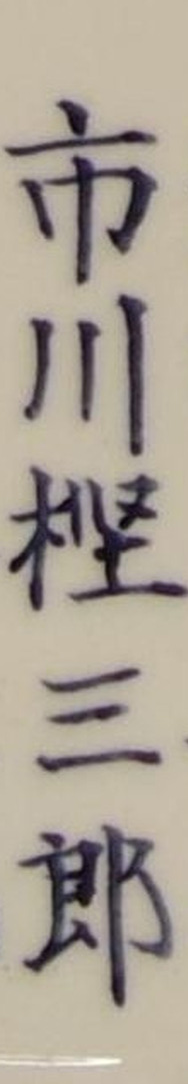市川樫三郎
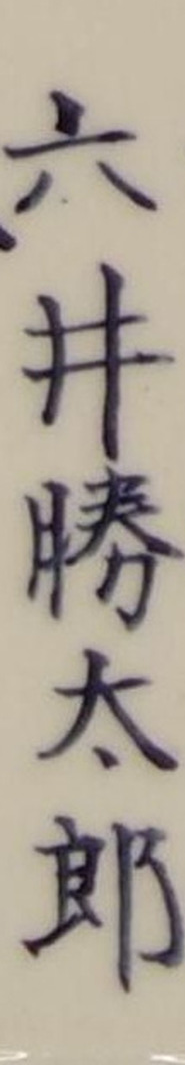六井勝太郎
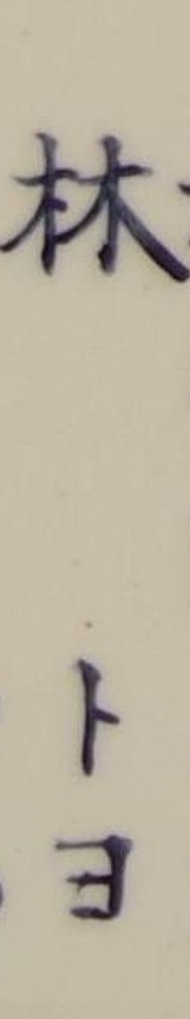林トヨ

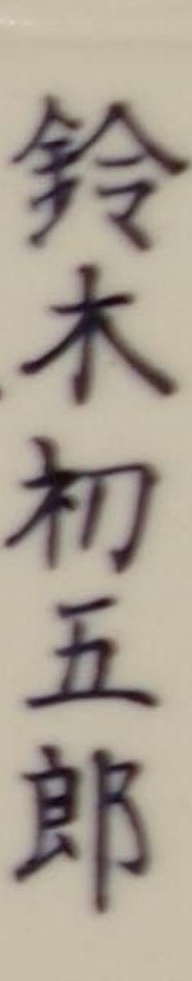鈴木初五郎
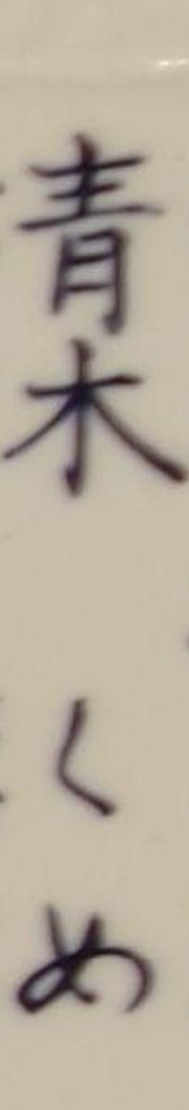青木くめ
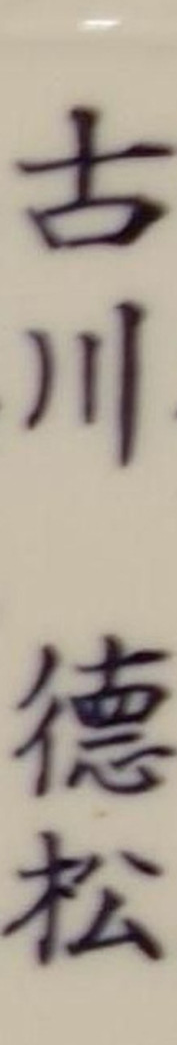古川徳松
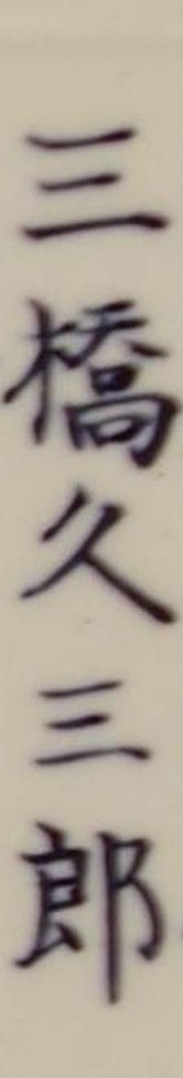三橋久三郎
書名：M~S
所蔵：高野山金剛峯寺
